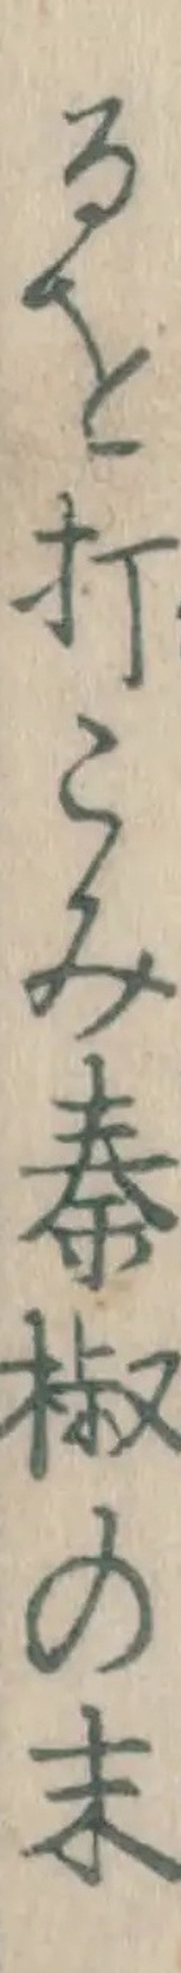るを打こみ秦椒の末

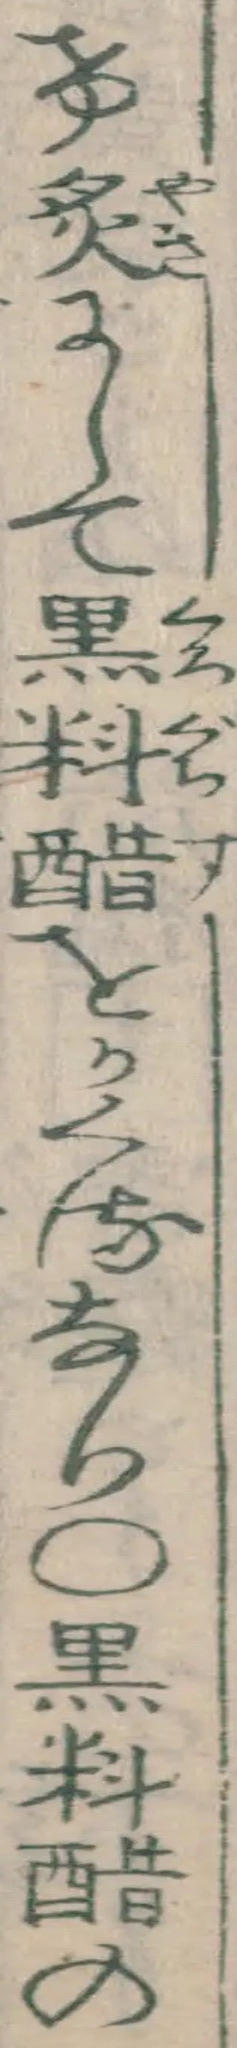け炙にして黒料醋をかくるなり○黒料醋の
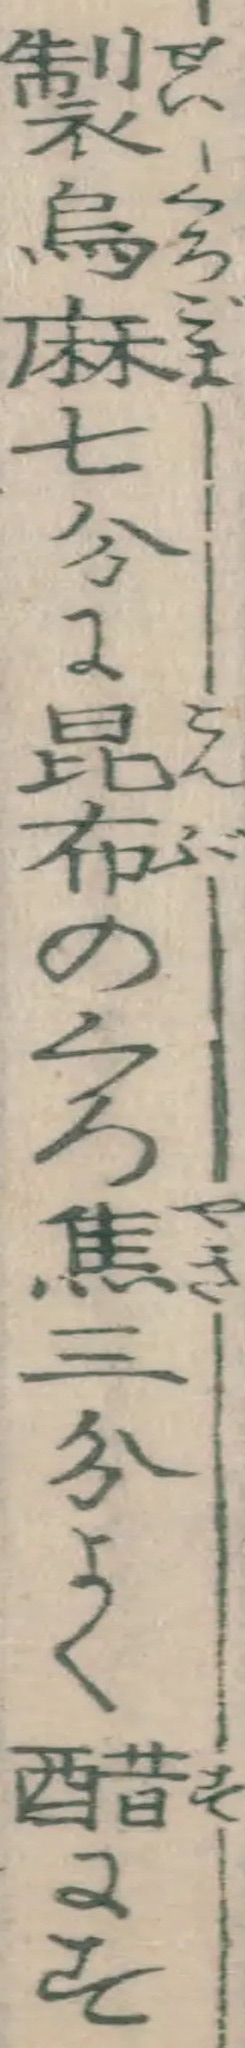製烏麻七分に昆布のくろ焦三分よく醋にす
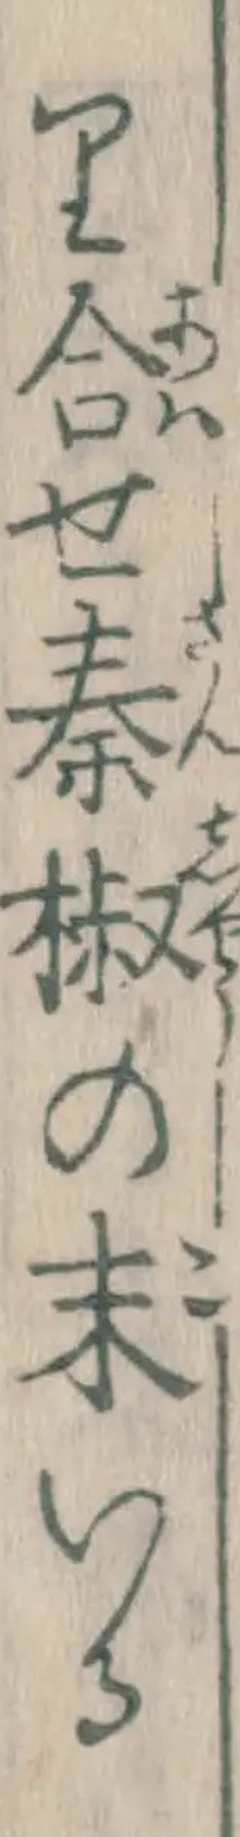り合せ秦椒の末いる
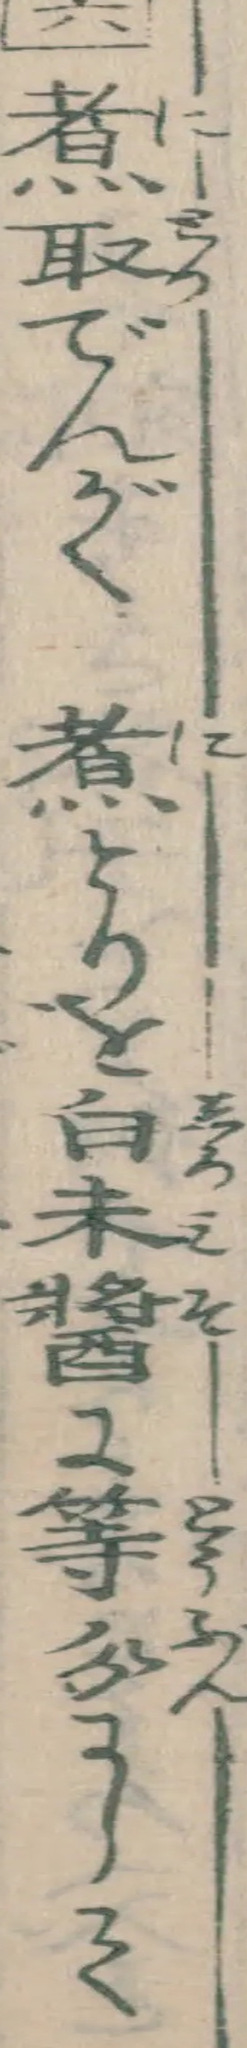五十六煮取でんがく煮とりを白未醤に等分にして
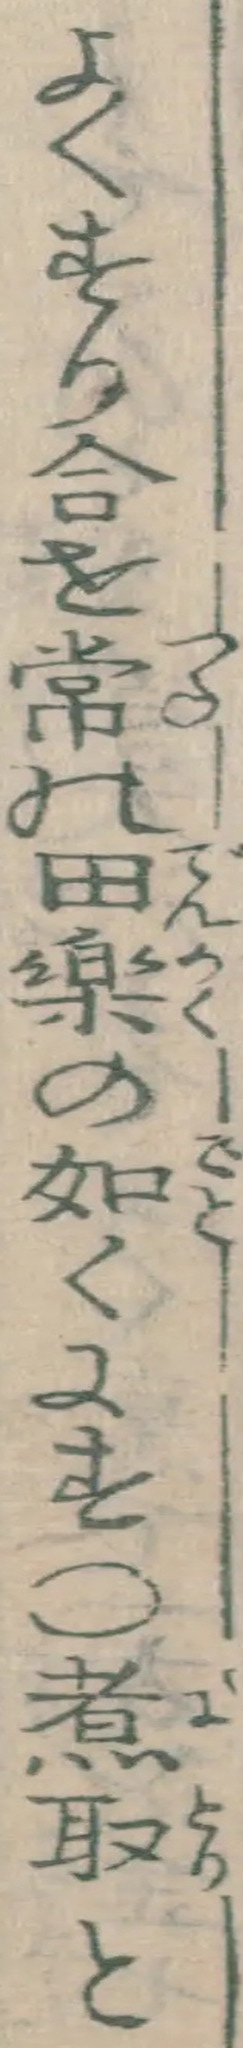よくすり合せ常の田楽の如くにす○煮取と
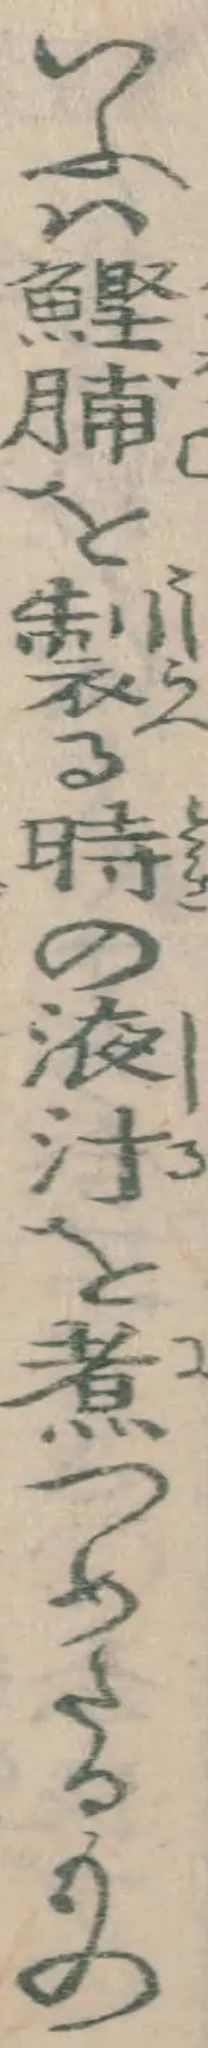いふは鰹脯を製る時の液汁を煮つめたるもの
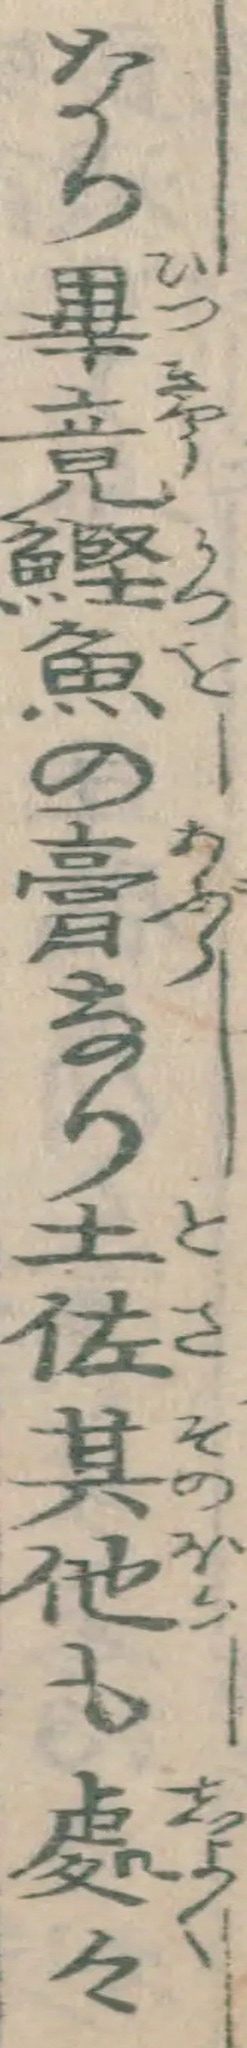なり畢竟鰹魚の膏なり土佐其他も処々
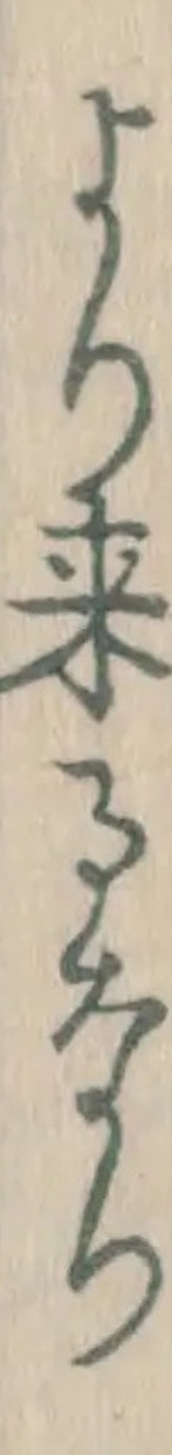より来るなり
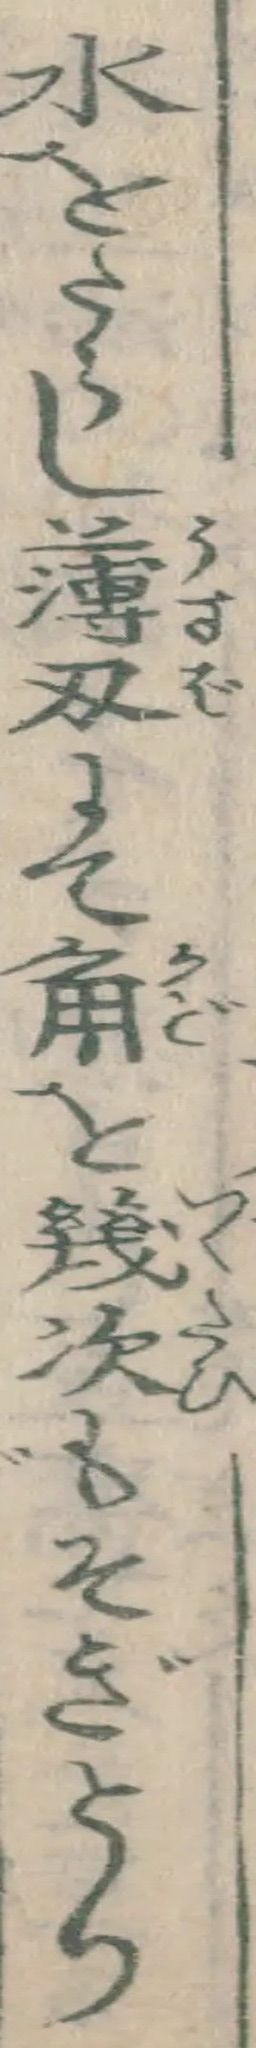水をたらし薄刃にて角を幾次もそぎとり
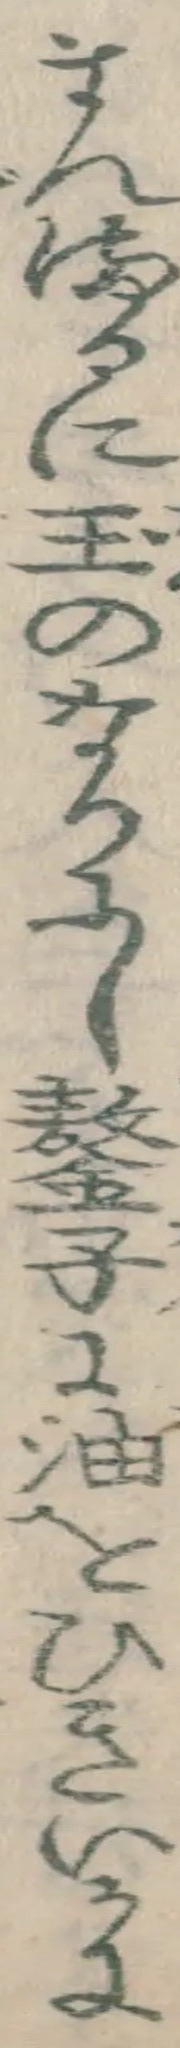まんまるに玉のなりにし鏊子に油をひきいかに
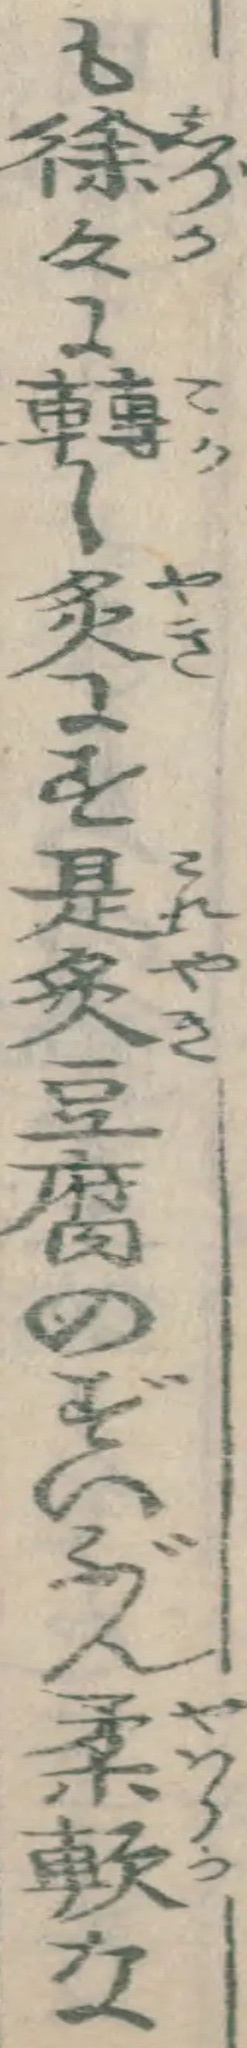も徐々に転し炙にす是炙豆腐のずいぶん柔軟な
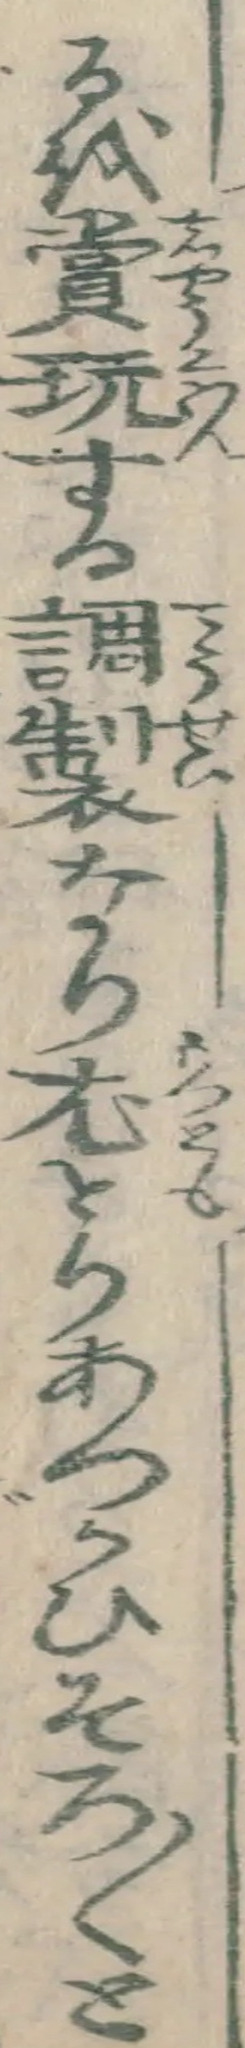るを賞玩する調製なり尤とりあつかひそろ〳〵と
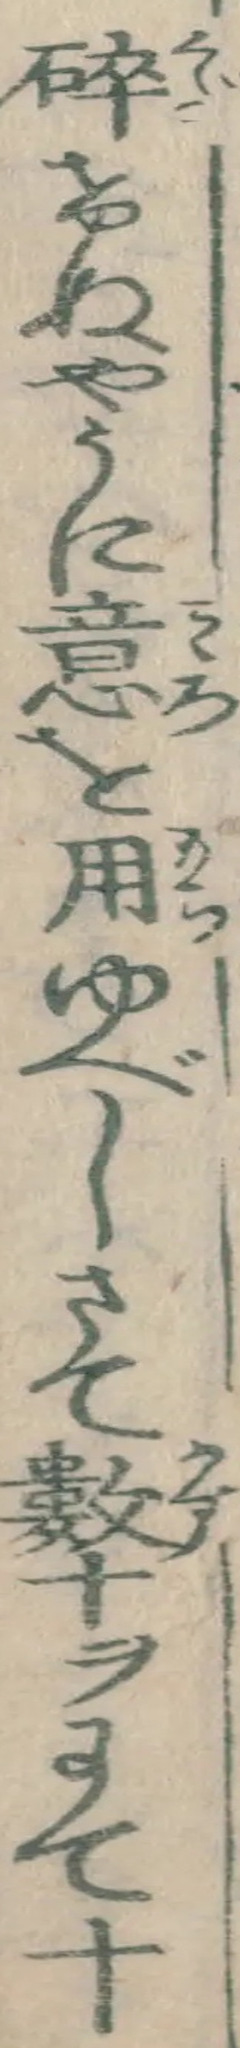砕けぬやうに意を用ゆべしさて数十をにて十

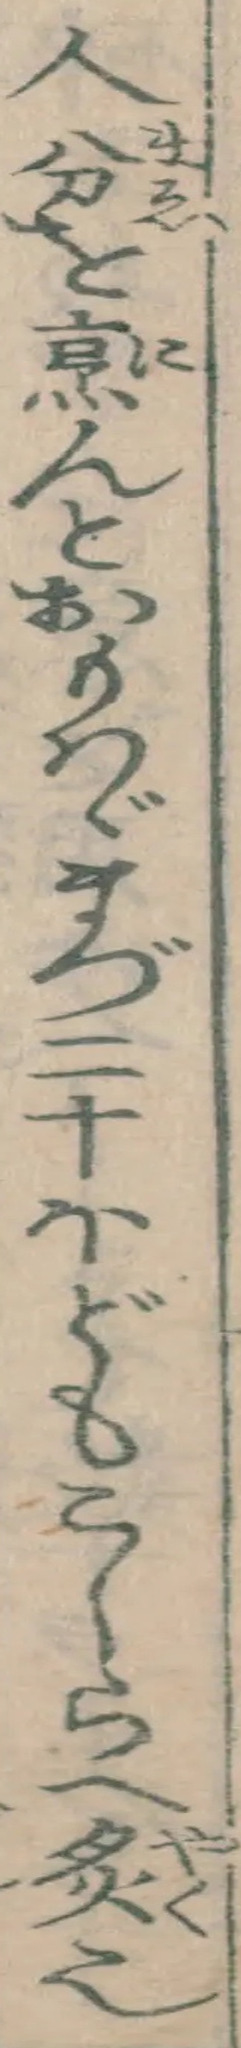人分を烹んとおもはゞまづ二十ほどもこしらへ炙也
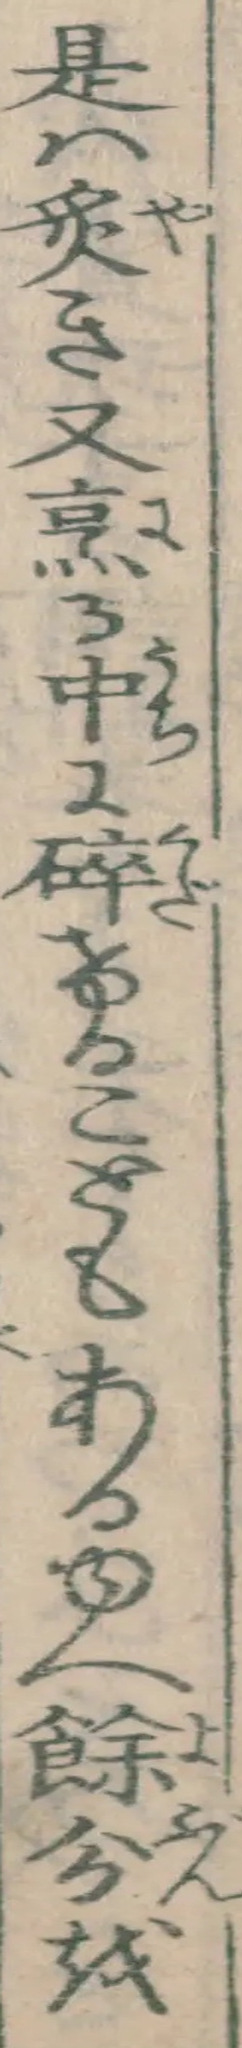是は炙き又烹る中に砕けることもあるゆへ余分を
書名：豆腐百珍. 続編
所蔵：国立国会図書館 National Diet Library, JAPAN
